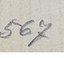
den 18ten
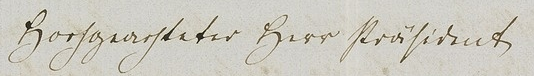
Hochgeachteter Herr Präsident
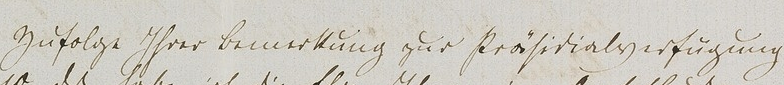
Zufolge Ihrer Bemerkung zur Präsidialverfügung
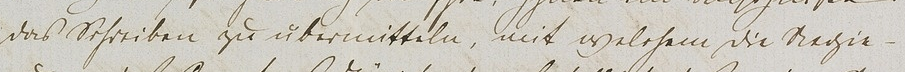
das Schreiben zu übermitteln, mit welchem die Regie-
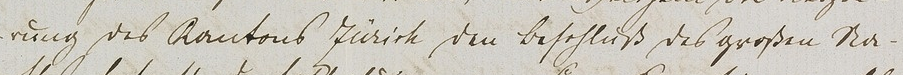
rung des Kantons Zürich den Beschluß des großen Ra-
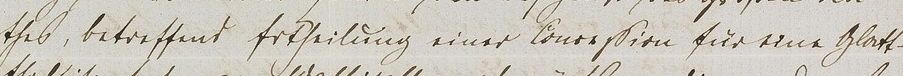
thes, betreffend Ertheilung einer Concession für eine Glatt-
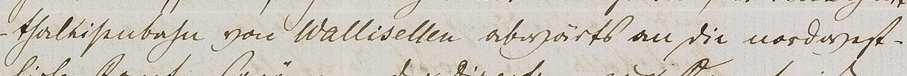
thaleisenbahn von Wallisellen abwärts an die nordwest-
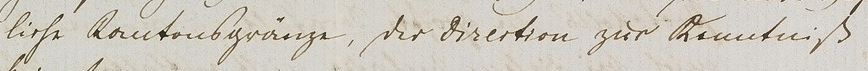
liche Kantonsgränze, der Direction zur Kenntniß
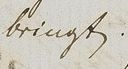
bringt.
